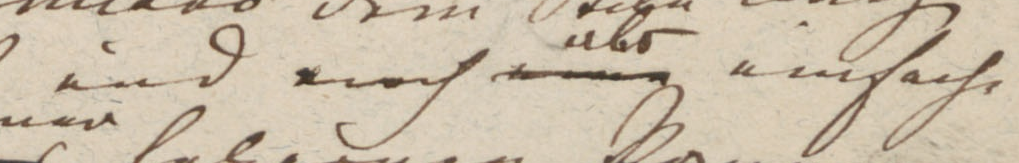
und noch eine als einfache
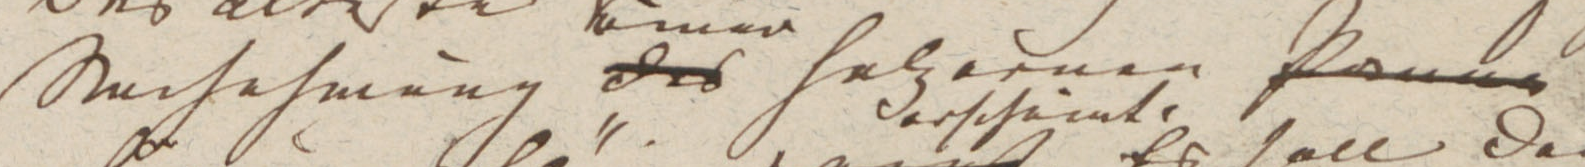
Nachahmung des einer holzernen Panne
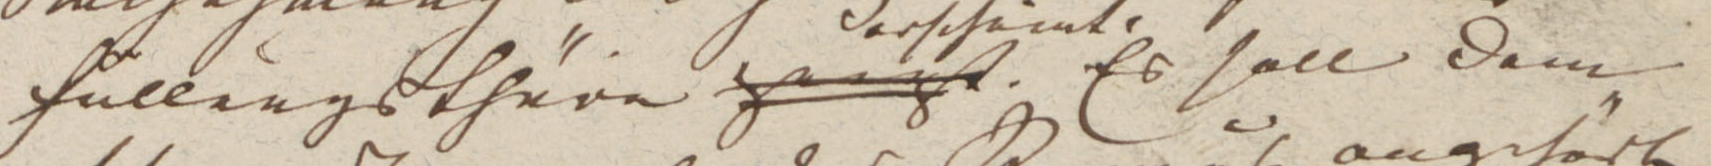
Füllungsthüre zeigt. erscheint. Es soll dem
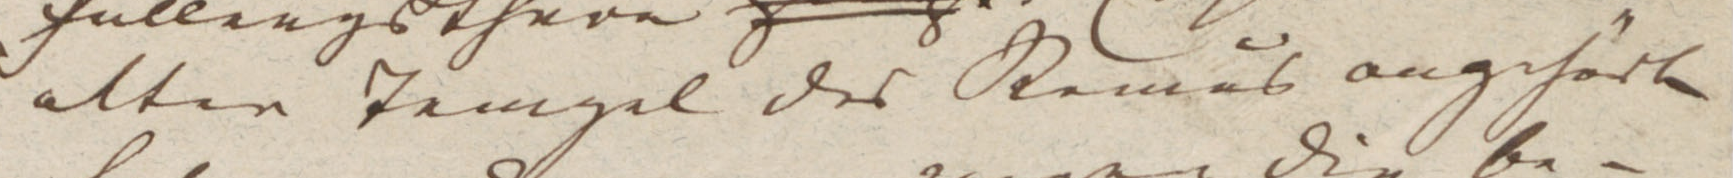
alten Tempel des Remus angehört
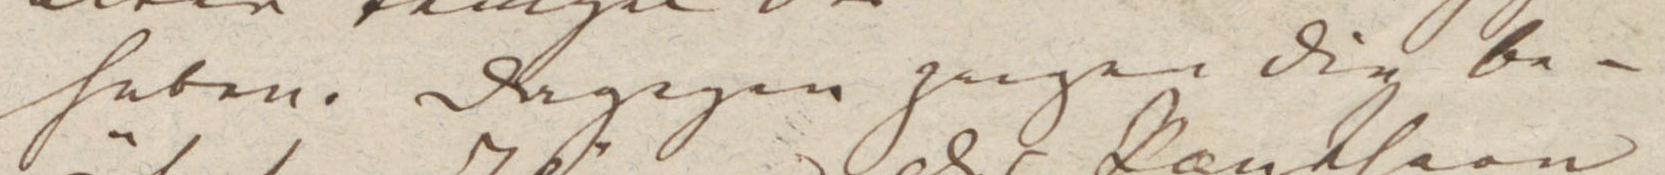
haben. Dagegen zeigen die be-
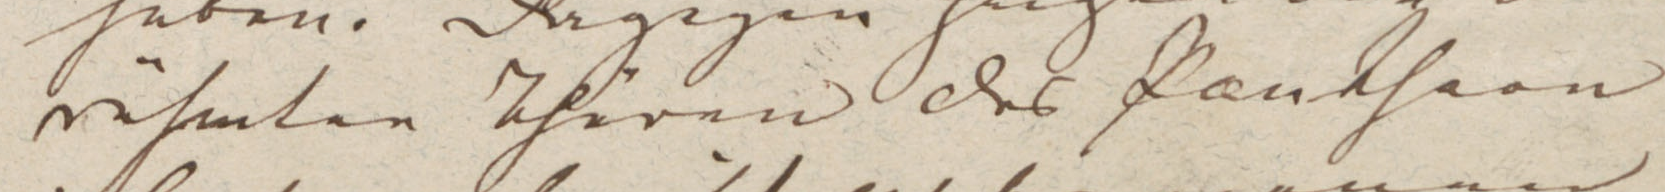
rühmten Thüren des Pantheon
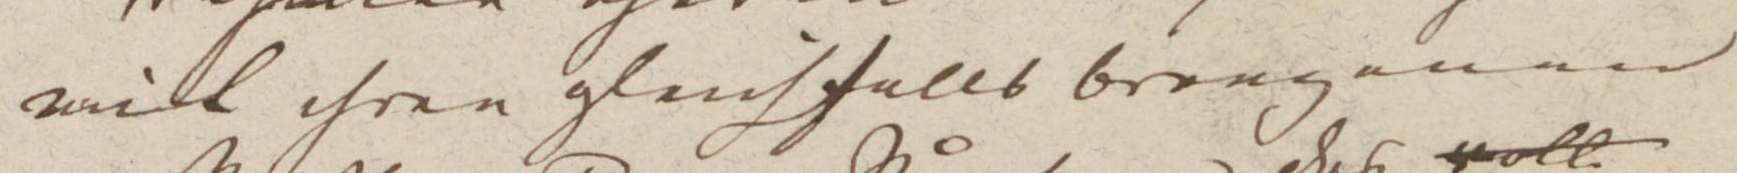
mit ihren gleichfalls bronzenen
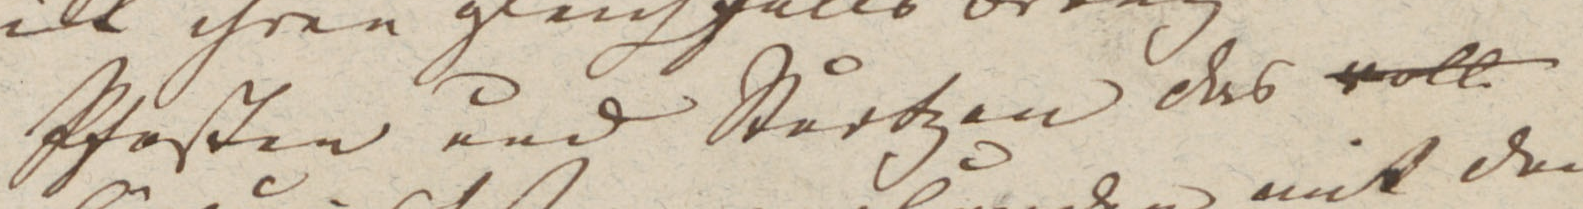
Pfosten und Sturtzen das voll
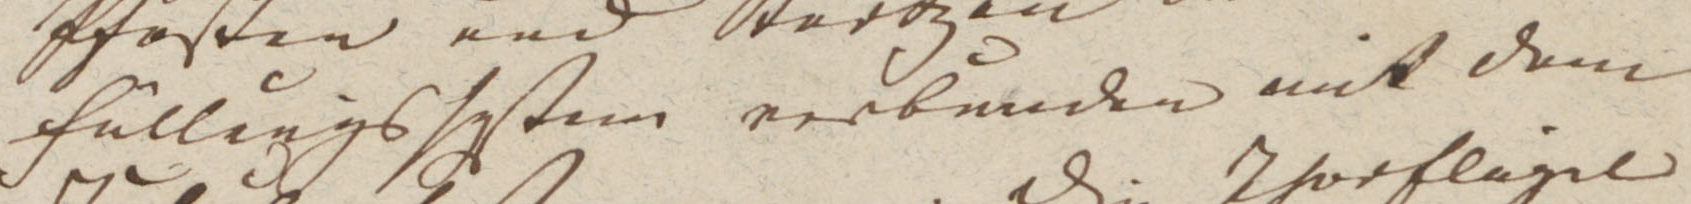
Füllungssystem verbunden mit dem
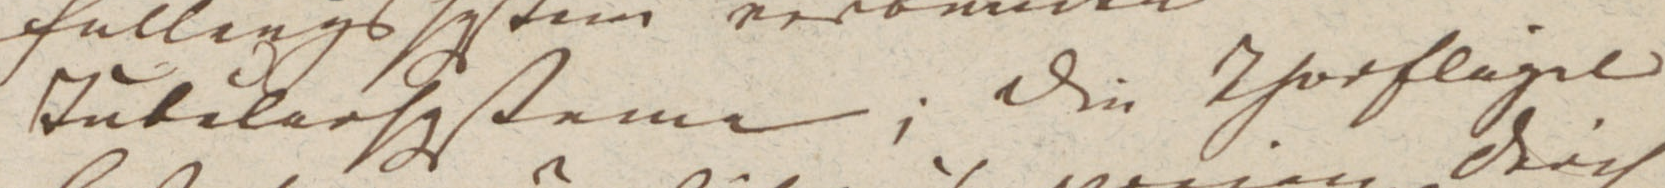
Tubularsysteme; Die Thorflügel
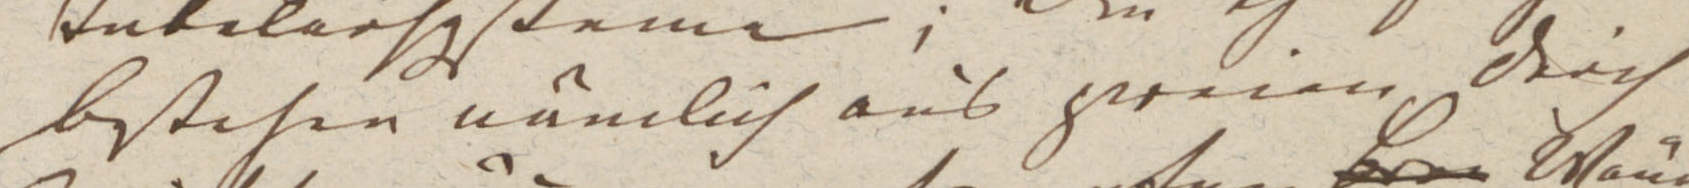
bestehen nämlich aus zweien durch
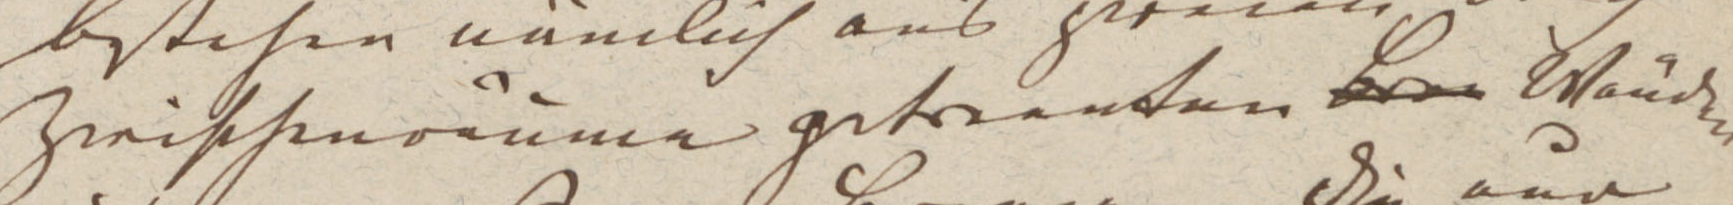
Zwischenräume getrennten Bron Wänden
